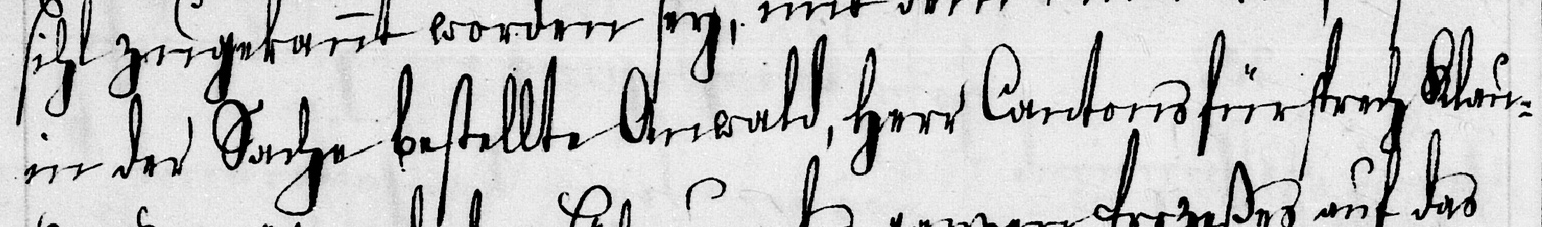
in der Sache bestellte Anwald, Herr Cantonsfürsprech Klau¬
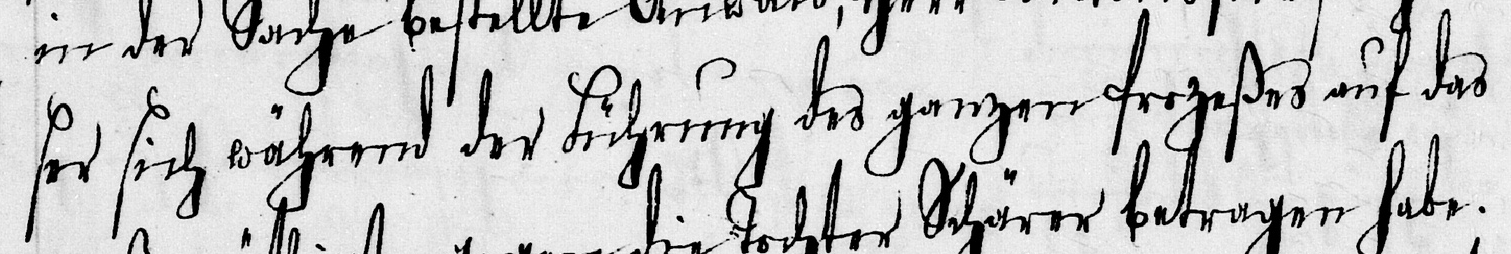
ser sich während der Führung des ganzen Prozeßes auf das
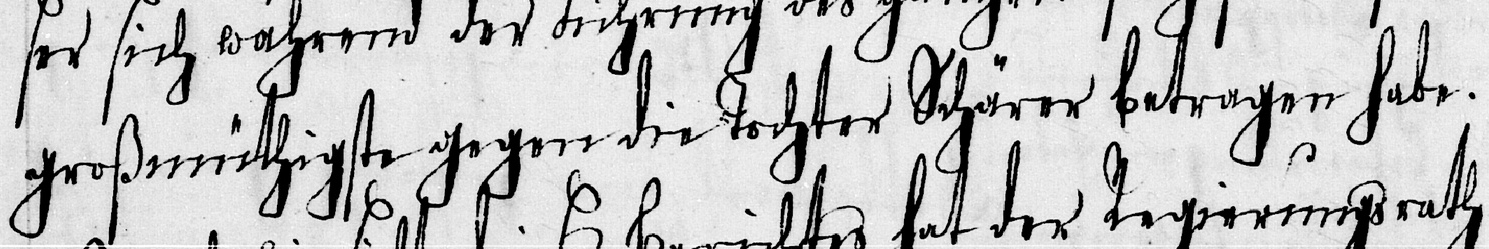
großmüthigste gegen die Tochter Schärer betragen habe.
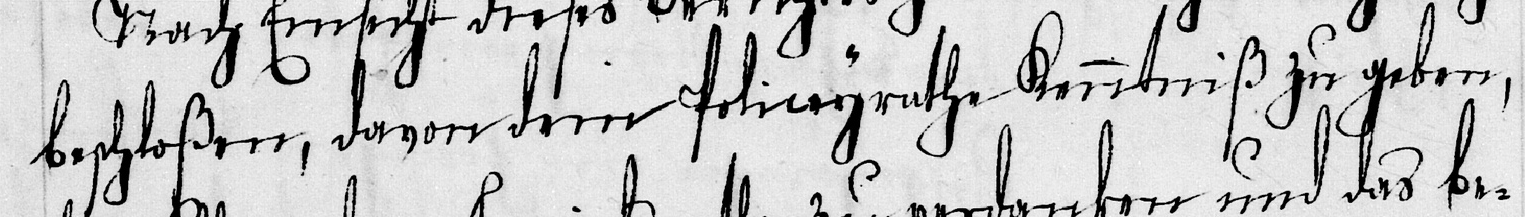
beschloßen, davon dem Policeyrathe Kenntniß zu geben,
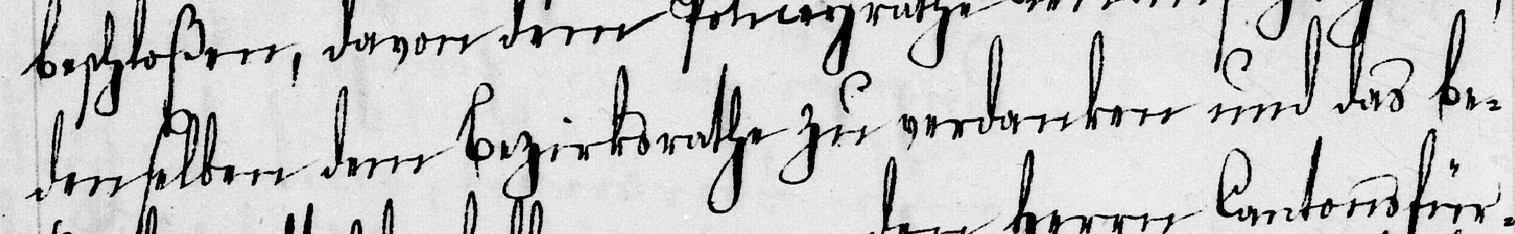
denselben dem Bezirksrathe zu verdanken und das be¬
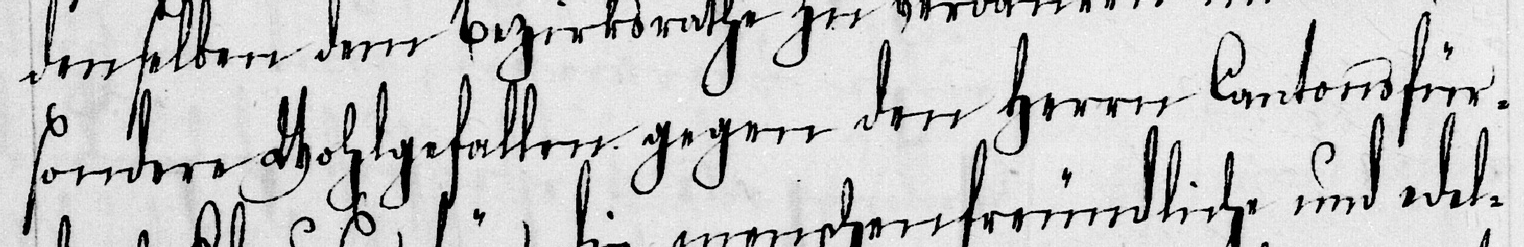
sondere Wohlgefallen gegen den Herrn Cantonsfür¬
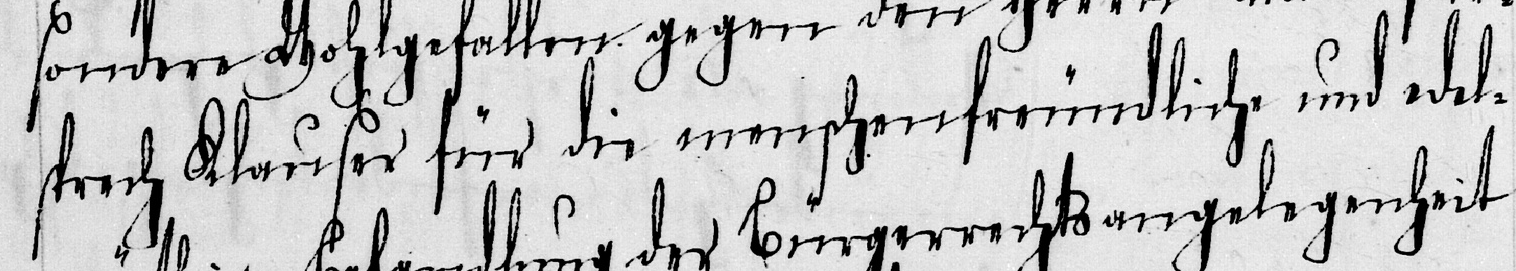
sprech Klauser für die menschenfreundliche und edel¬
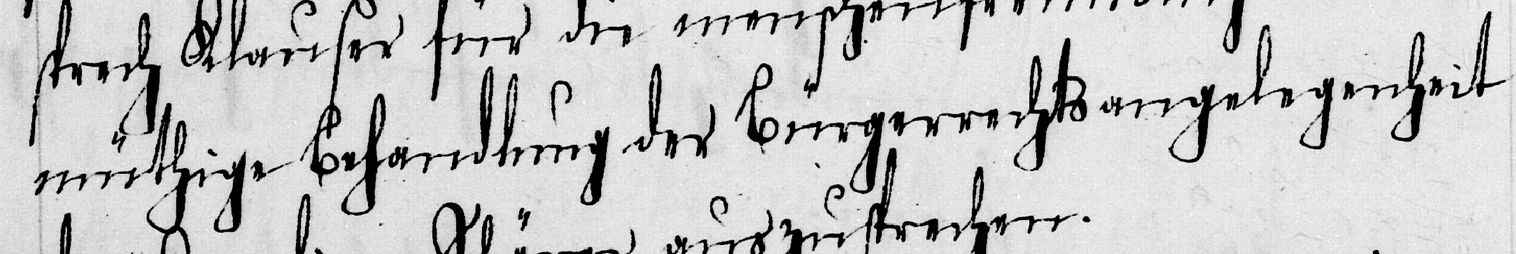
müthige Behandlung der Bürgerrechtsangelegenheit
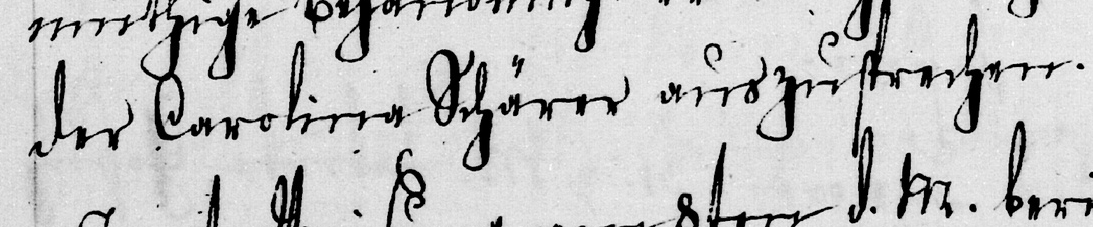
der Carolina Schärer auszusprechen.
